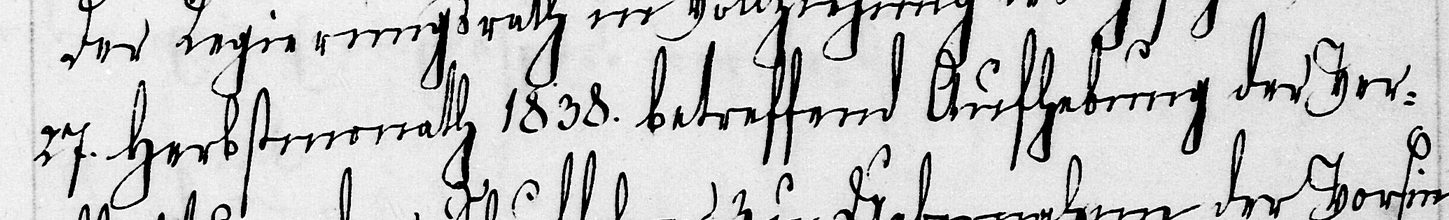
27. Herbstmonath 1838. betreffend Aufhebung der Ver¬
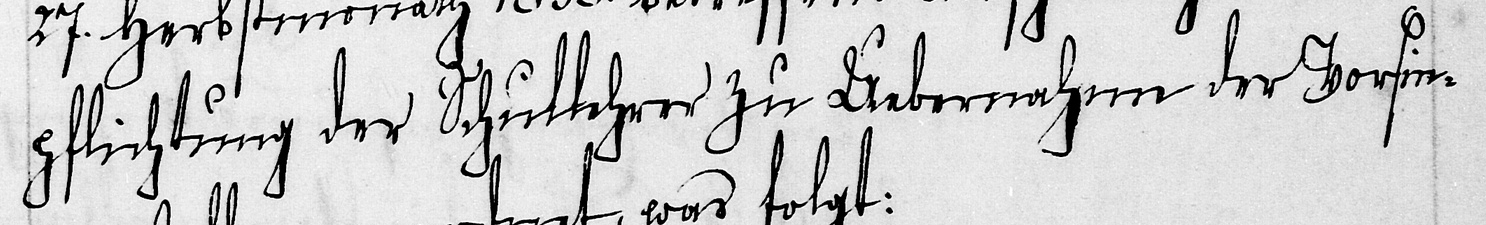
pflichtung der Schullehrer zu Uebernahme der Vorsin¬
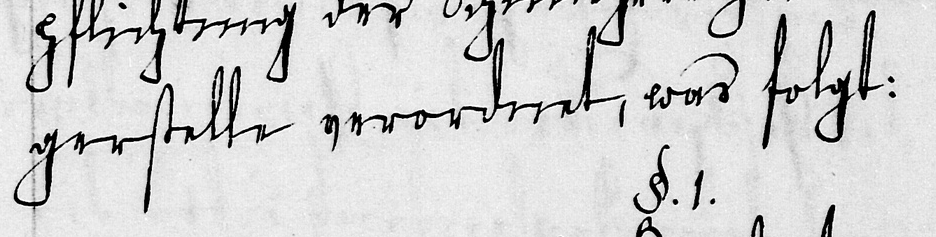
gerstelle verordnet, was folgt:
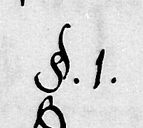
§. 1.
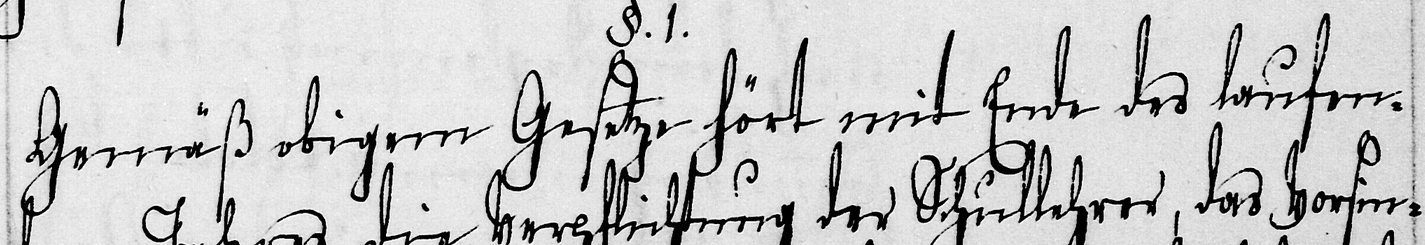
Gemäß obigem Gesetze hört mit Ende des laufen¬
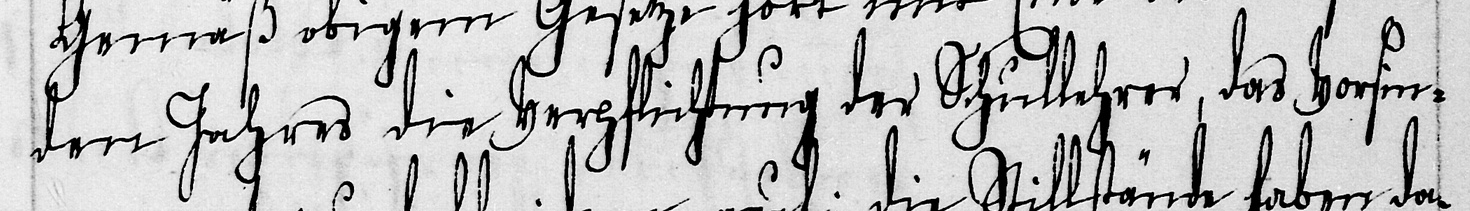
den Jahres die Verpflichtung der Schullehrer, das Vorsi¬
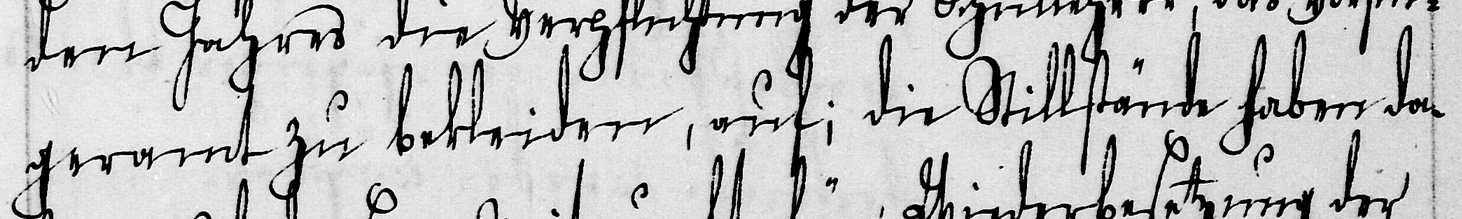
ngeramt zu bekleiden, auf; die Stillstände haben da¬
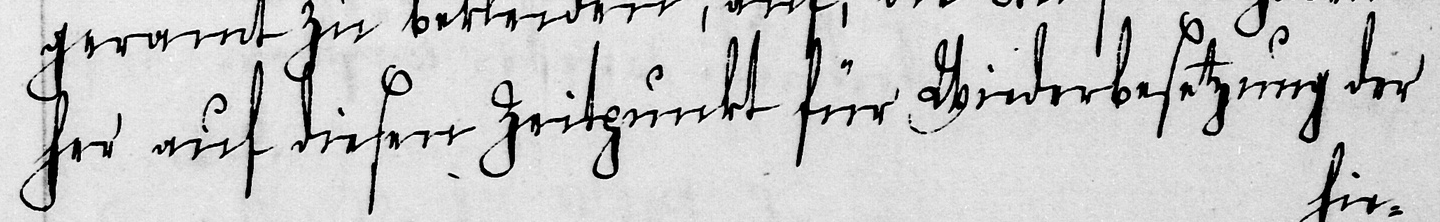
her auf diesen Zeitpunkt für Wiederbesetzung der
